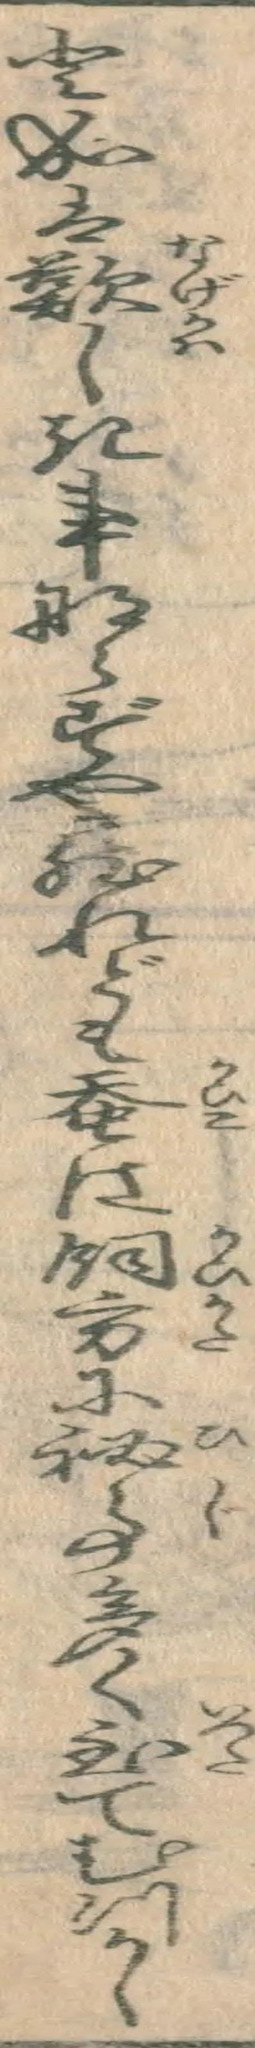と成は歎しき事ならずや然れども蚕は飼方に秘事多く至てむつかし
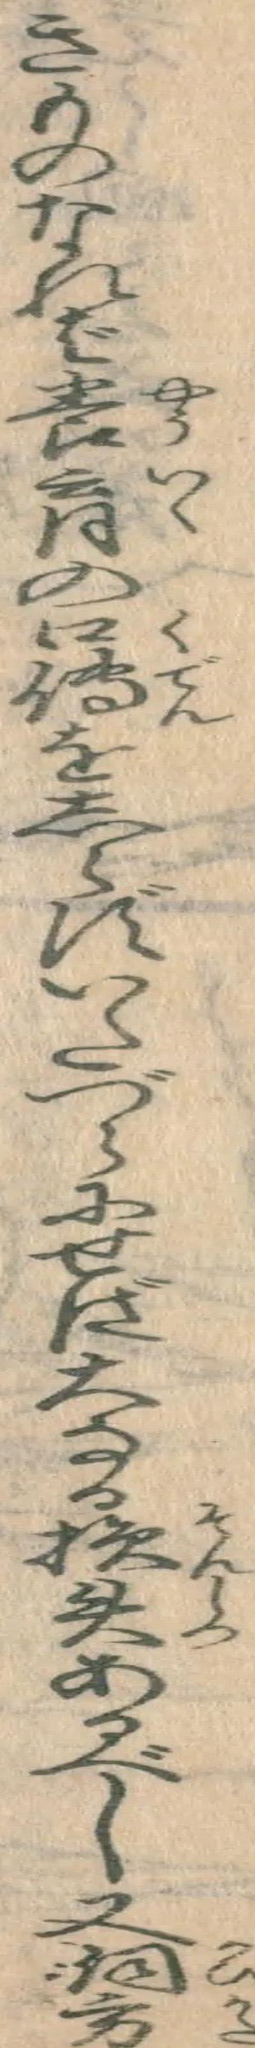きものなれば養育の口伝をしらずいたづらにせば大なる損失あるべし又飼方
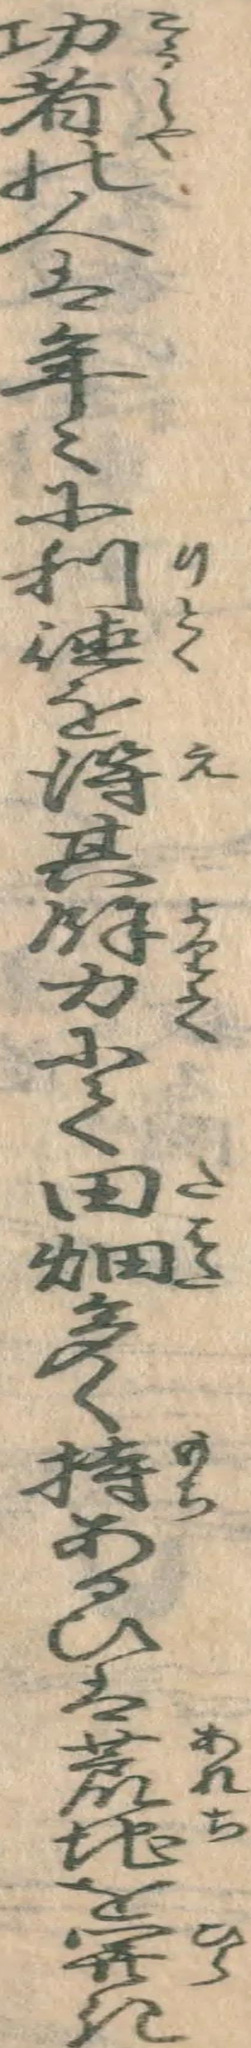功者の人は年々に利徳を得其余力にて田畑多く持あるひは荒地を開き
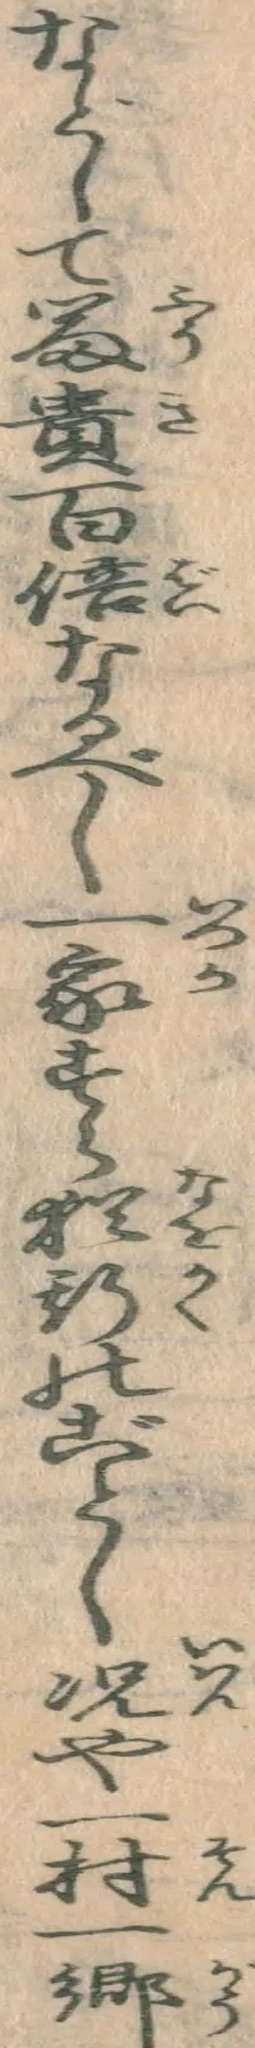などして富貴百倍なるべし一家すら猶斯のごとし況や一村一郷
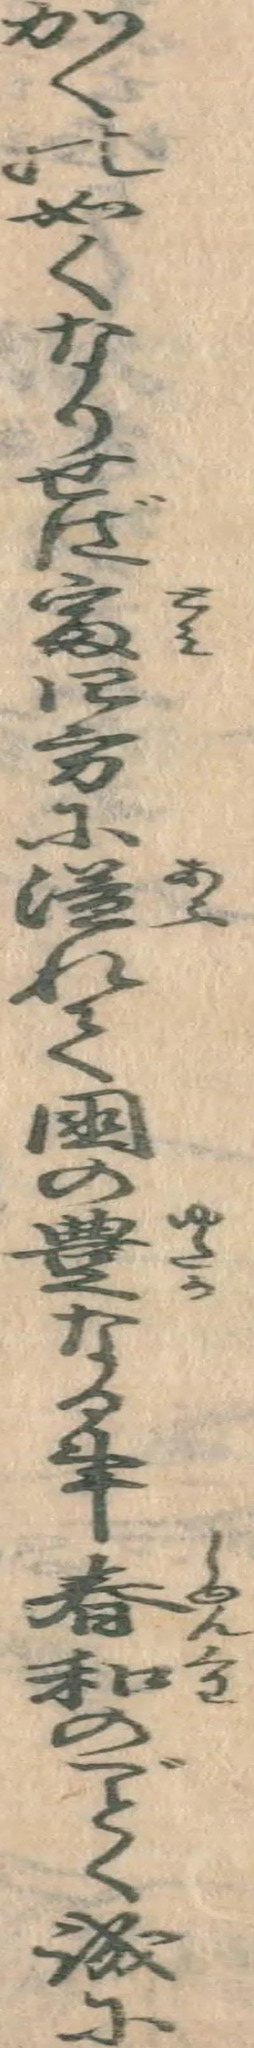かくの如くなりせば富四方に溢れて国の豊なる事春和のごとく誠に
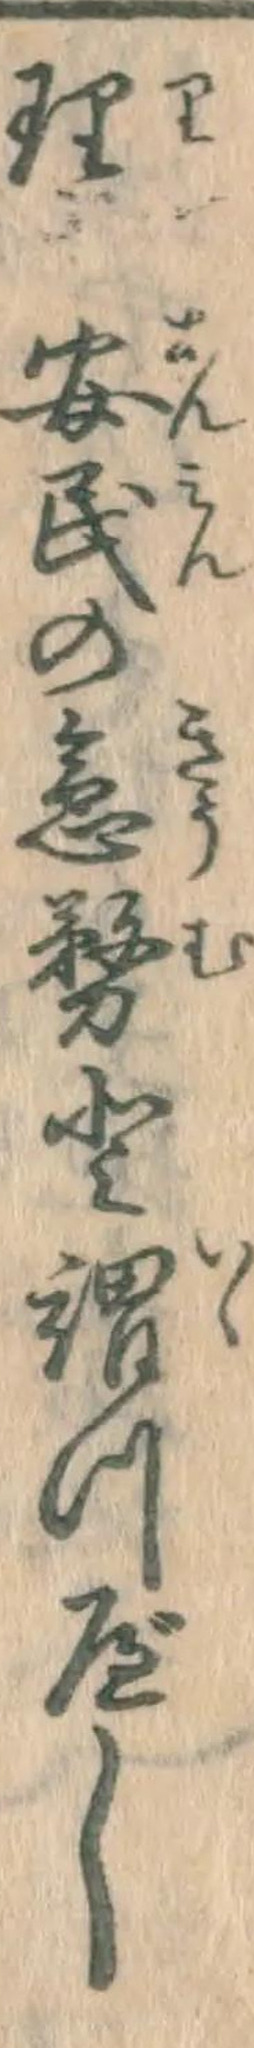理世安民の急務と謂つべし
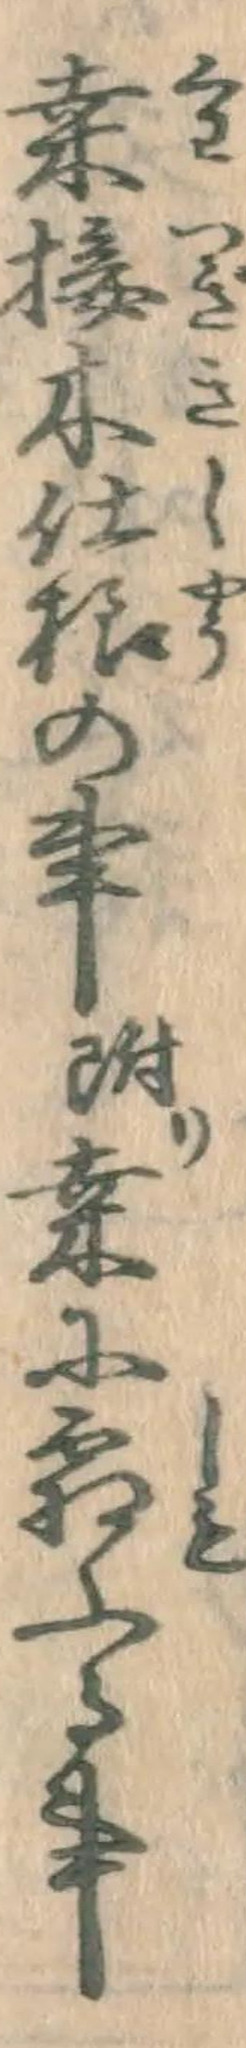桑接木仕様の事附り桑に霜ふる事
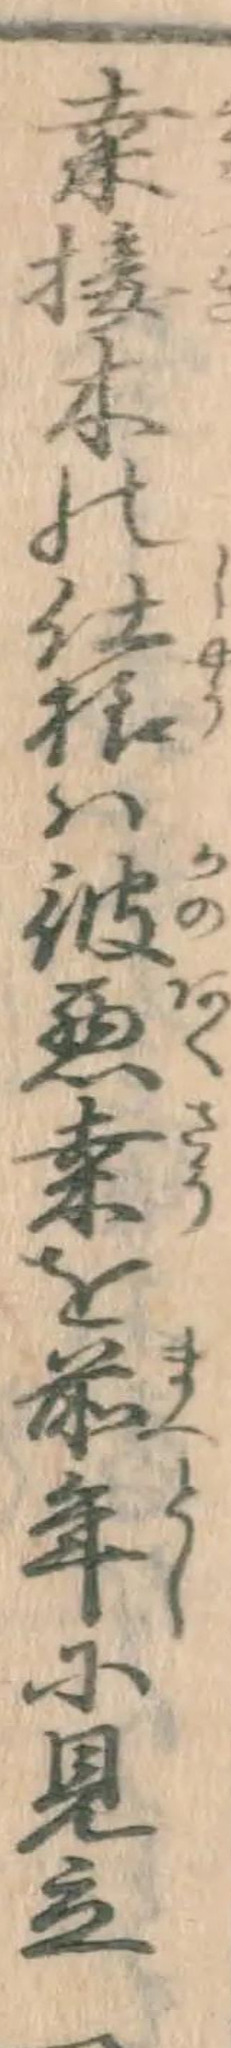桑接木の仕様は彼悪桑を前年に見立
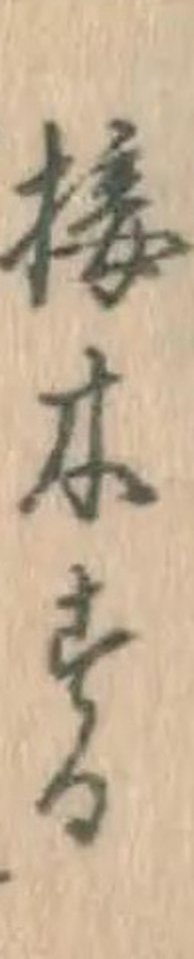接木する
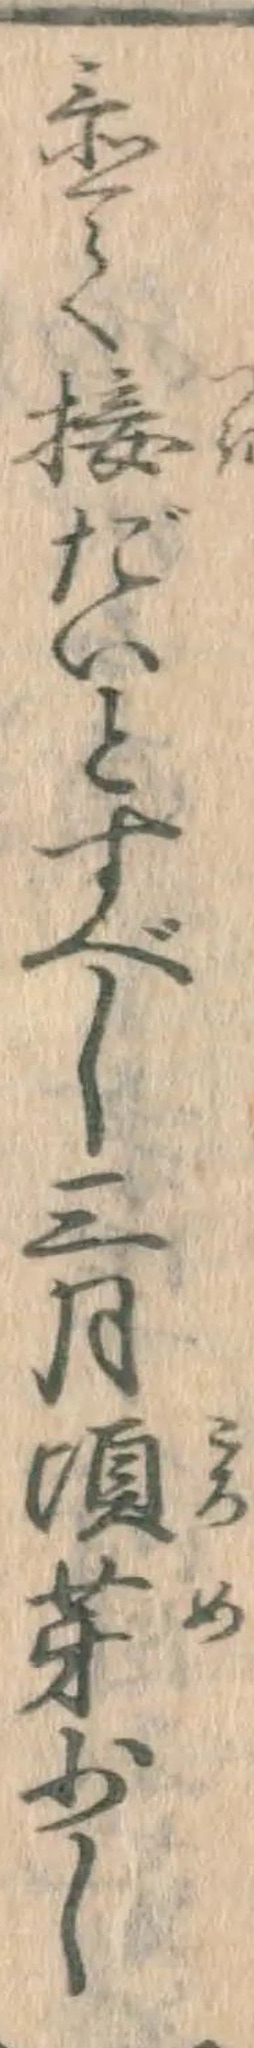置て接だいとすべし三月頃芽少し
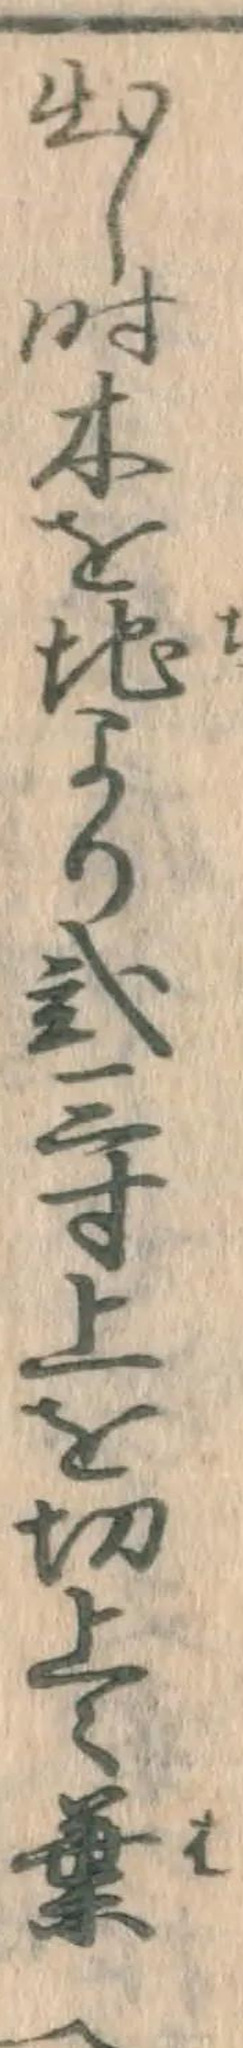出し時木を地より弐三寸上を切上々葉
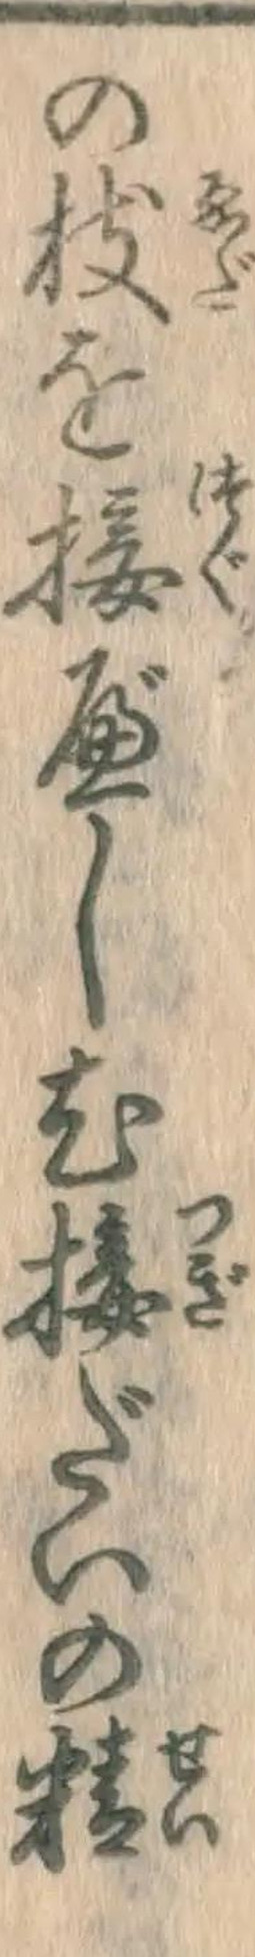の枝を接べし尤接だいの精
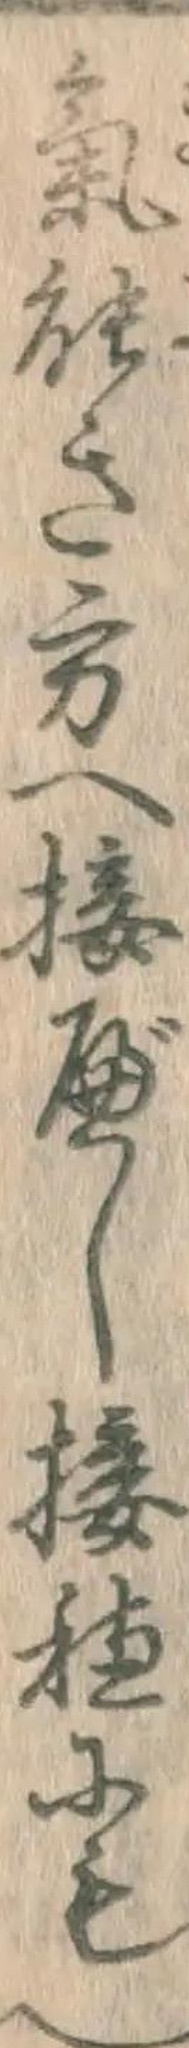気能き方へ接べし接穂にも
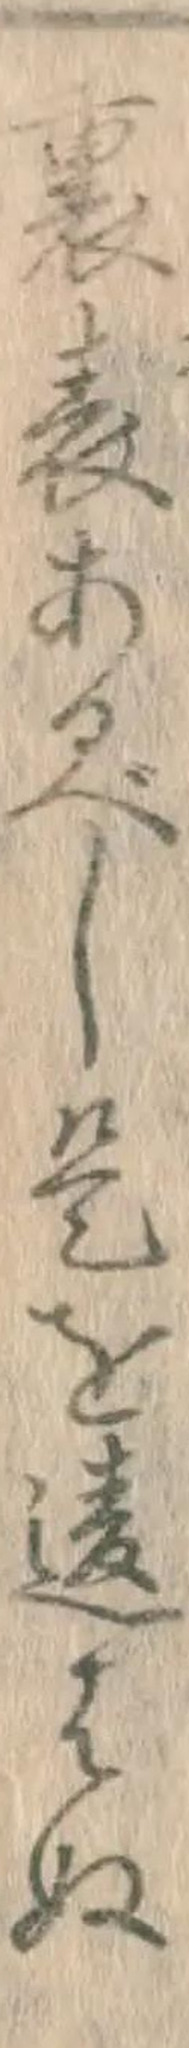裏表あるべし是を違はぬ
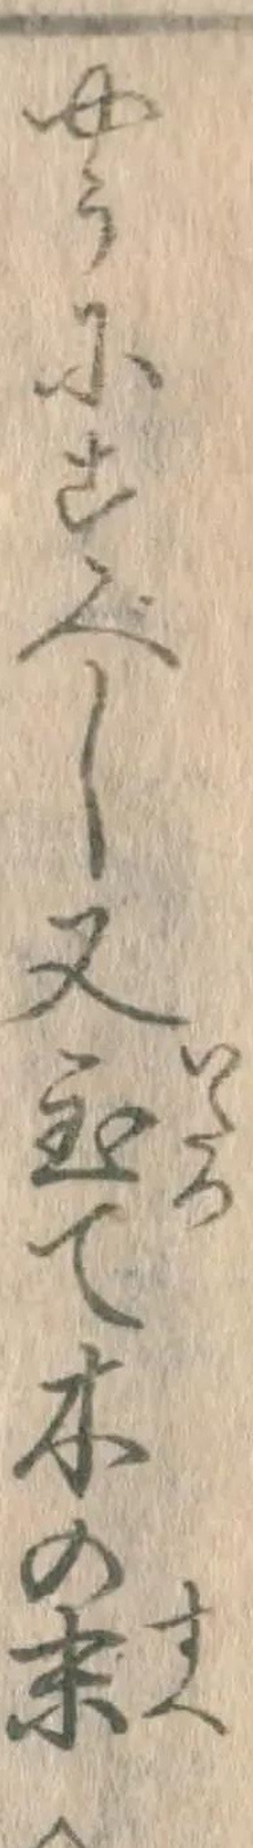やうにすべし又至て木の末
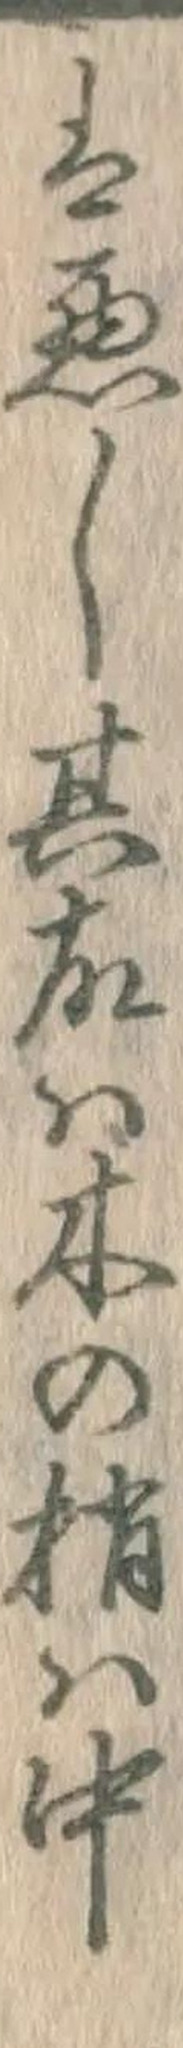は悪し其故は木の梢は中
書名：養蚕秘録 3巻. [1]
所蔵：国立国会図書館 National Diet Library, JAPAN
